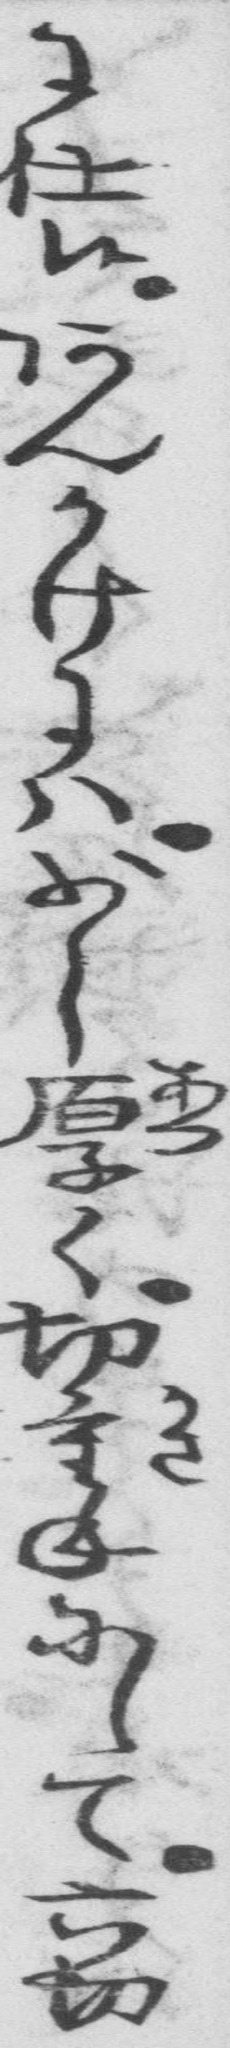に仕候。あんかけには。少し厚く。切重ねにして。六切
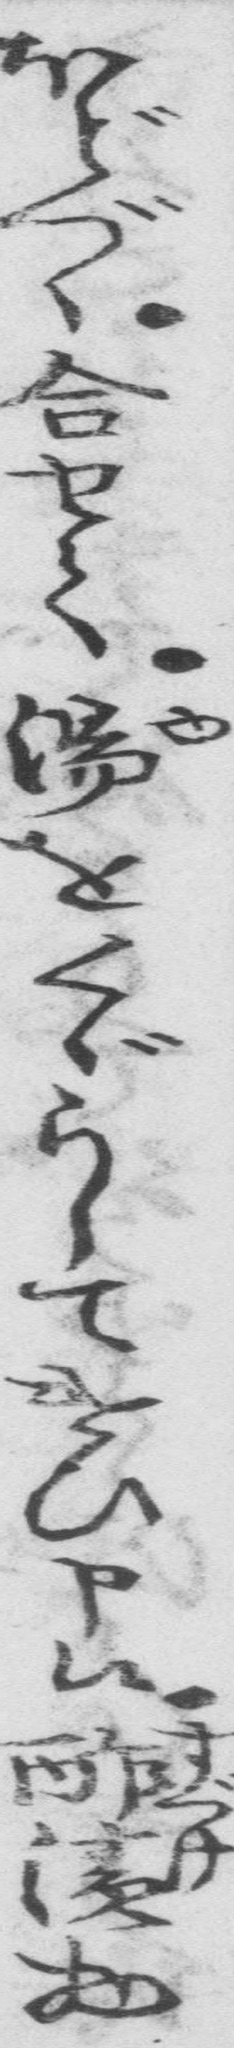ほどづゝ。合せて。湯をくゞらして遣ひ申候。酢漬物
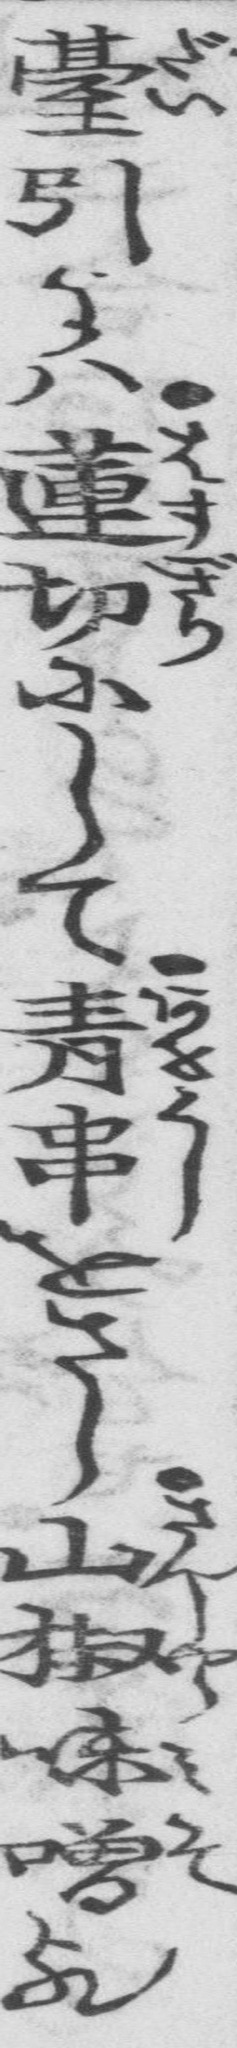台引には。蓮切にして。青串をさし。山椒味噌歟
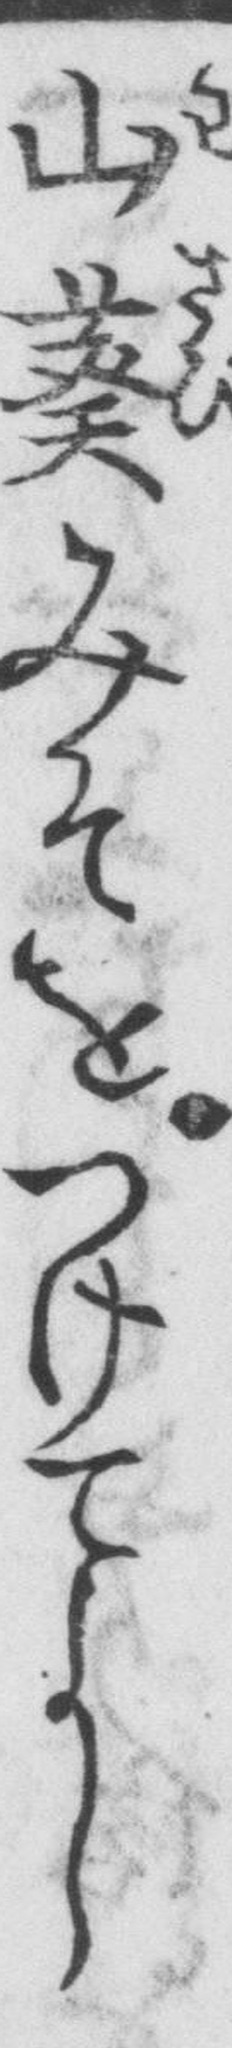山葵みそを。つけてよし
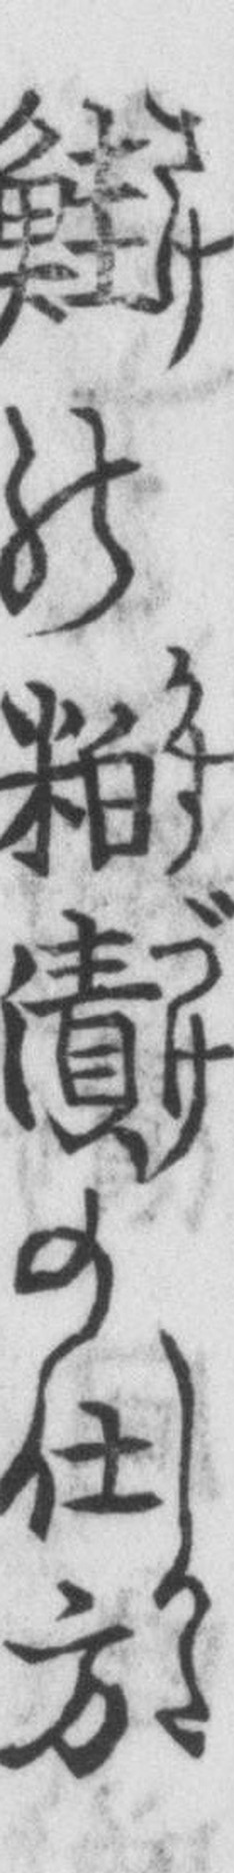鮭の粕漬の仕方
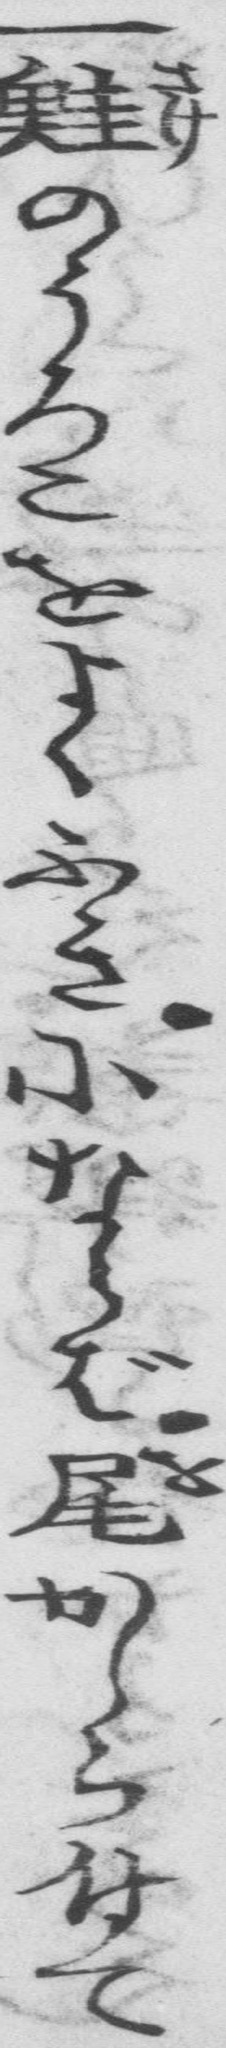一鮭のうろこをよくふき。小ならば。尾かしら付て
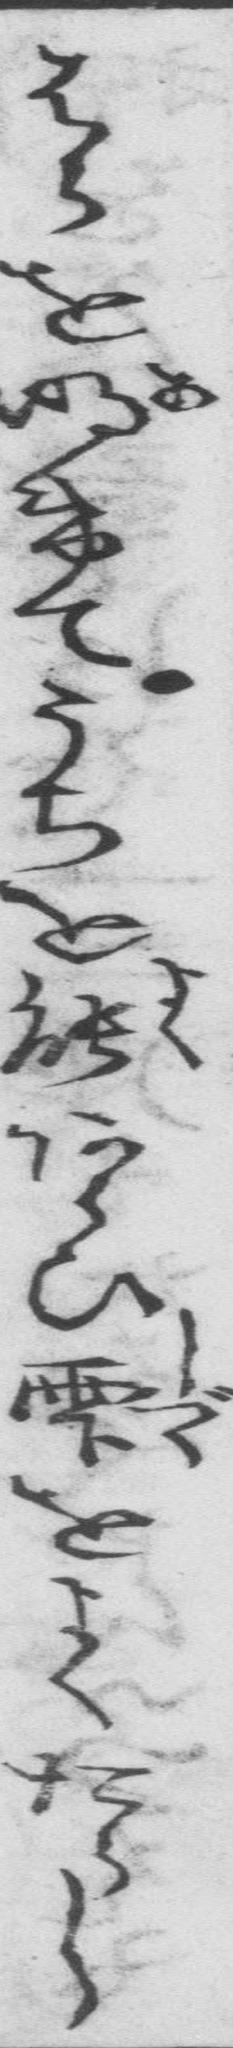はらを明けて。うちを能あらひ雫をよくたらし
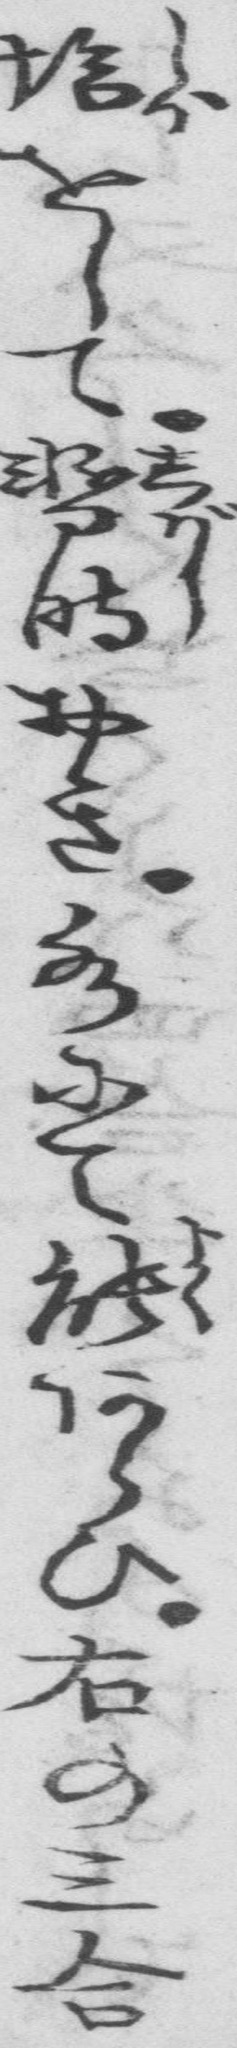塩をして。暫時おき。水にて能あらひ。右の三合
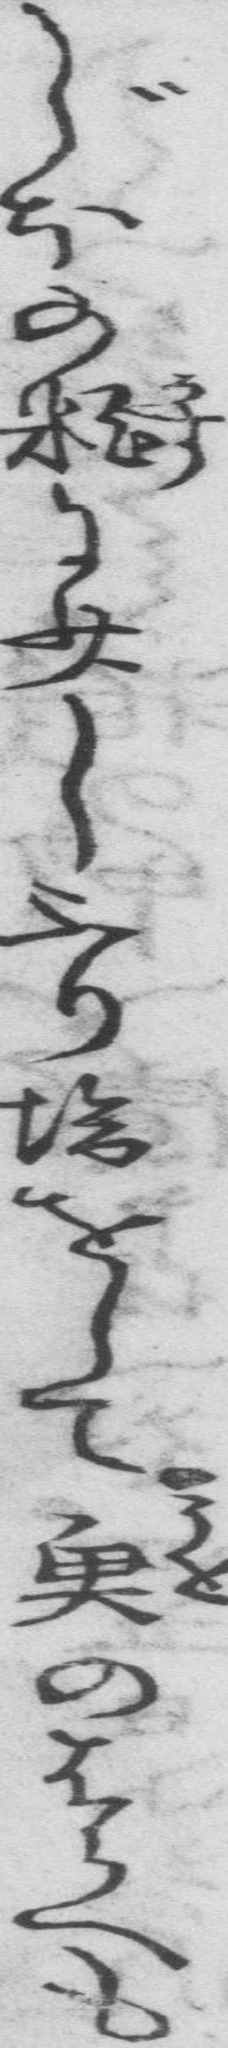じほの粕に少しふり塩をして。魚のはらへも

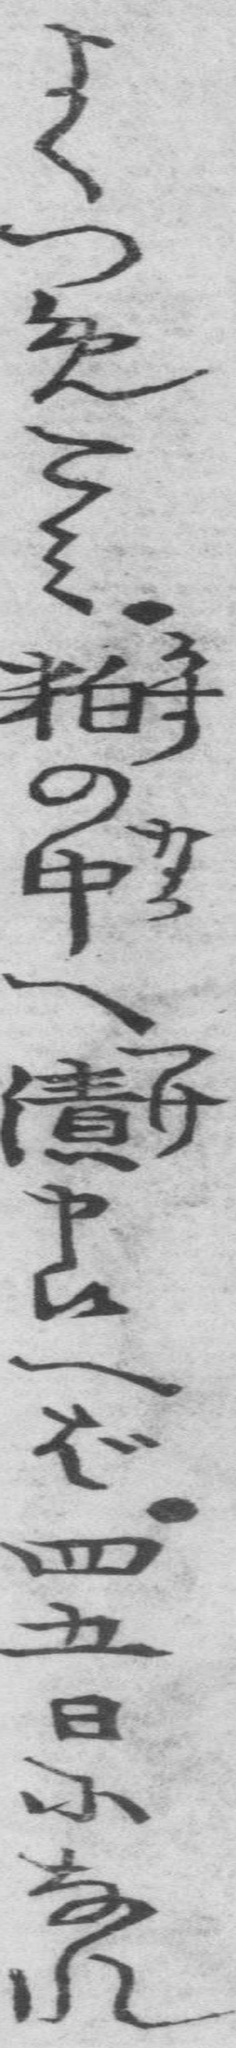よくつめこみ。粕の中へ漬申候へば。四五日になれ
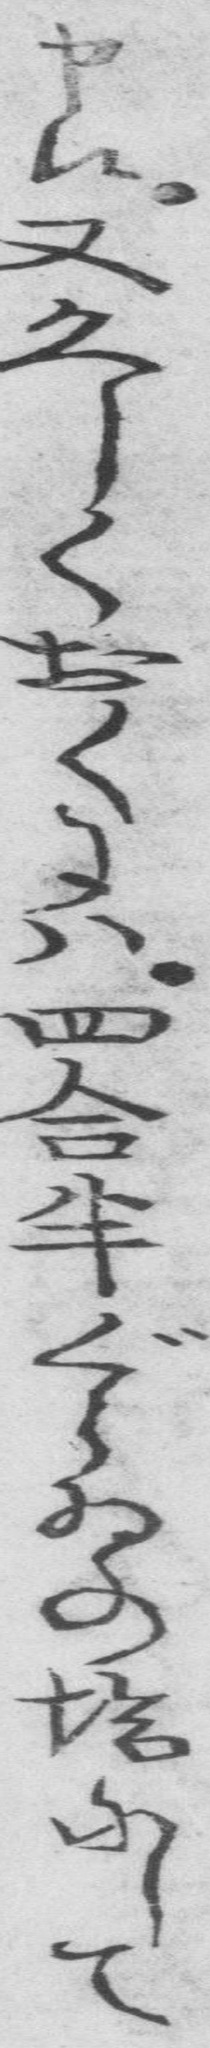申候。又久しくおくには。四合半ぐらゐの塩にして
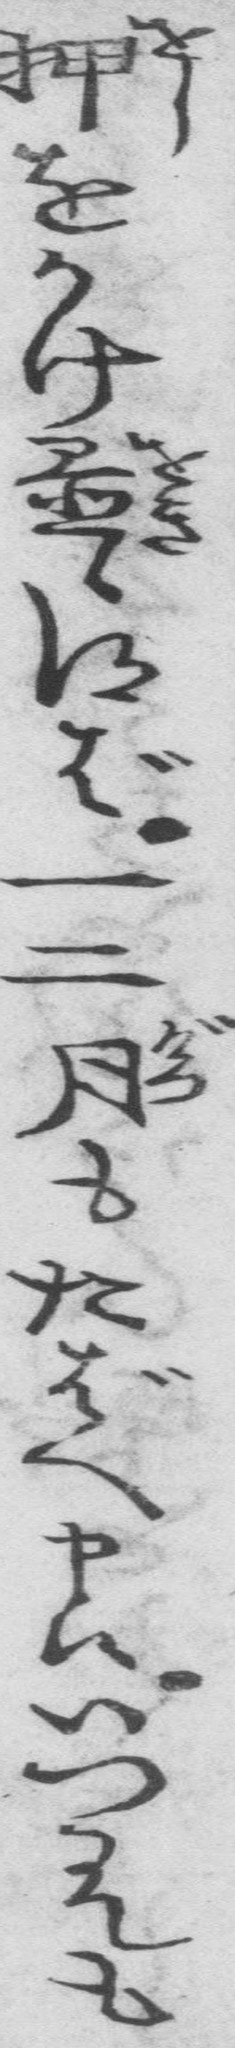押をかけ置候得ば、一二月もたばへ申候。いつにても
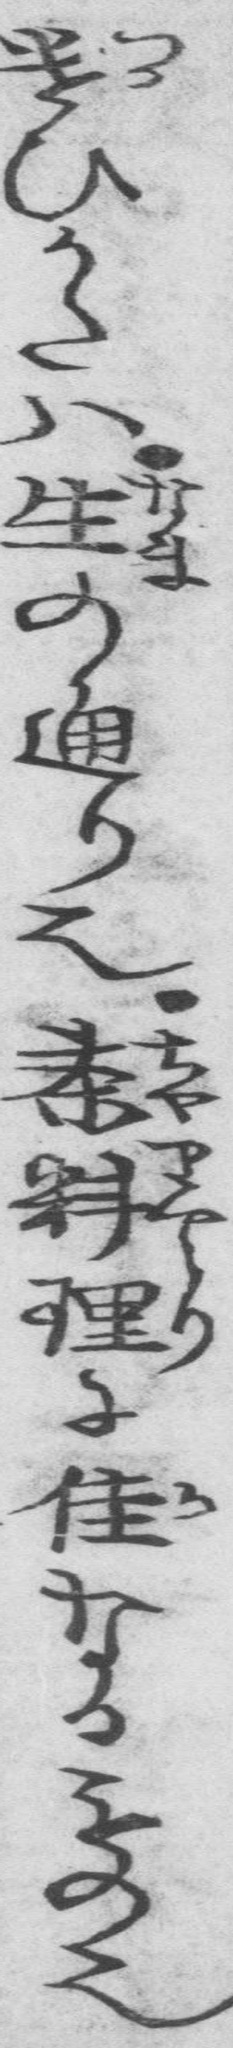遣ひかたは。生の通り也。茶料理に佳なるもの也
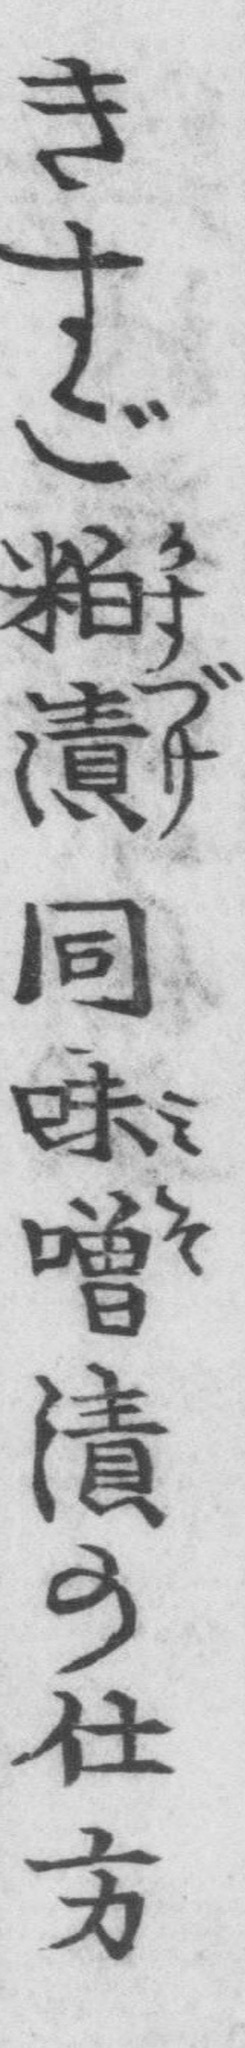きすご粕漬同味噌漬の仕方
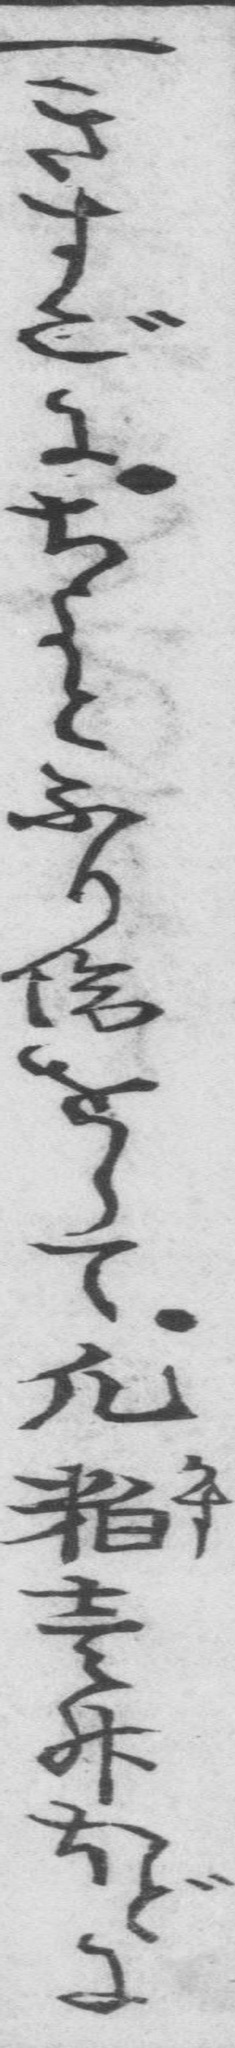一きすごに。ちよとふり塩をして。凡粕壱升ほどに
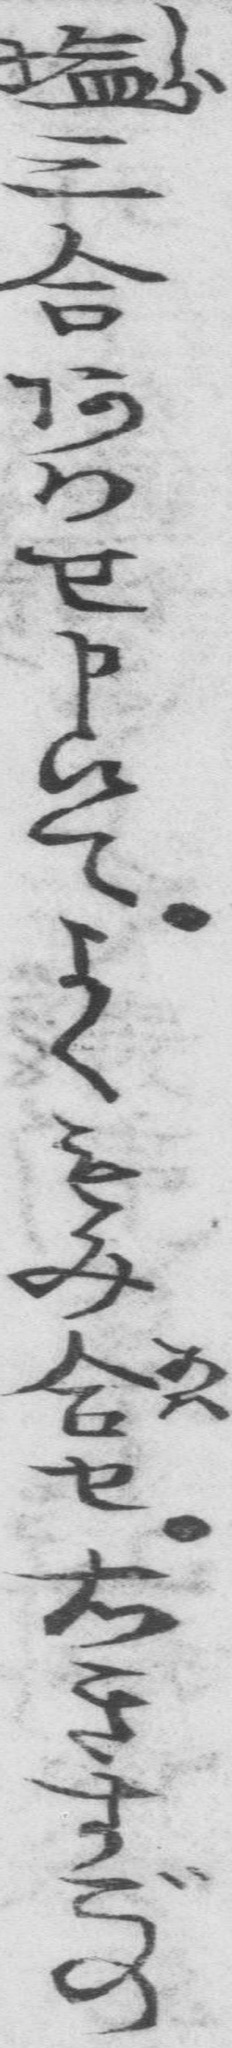塩三合あはせ申候て。よくもみ合せ。右きすごの
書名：萬寳料理秘密箱
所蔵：大阪府立大学学術情報センター 国文学研究資料館
